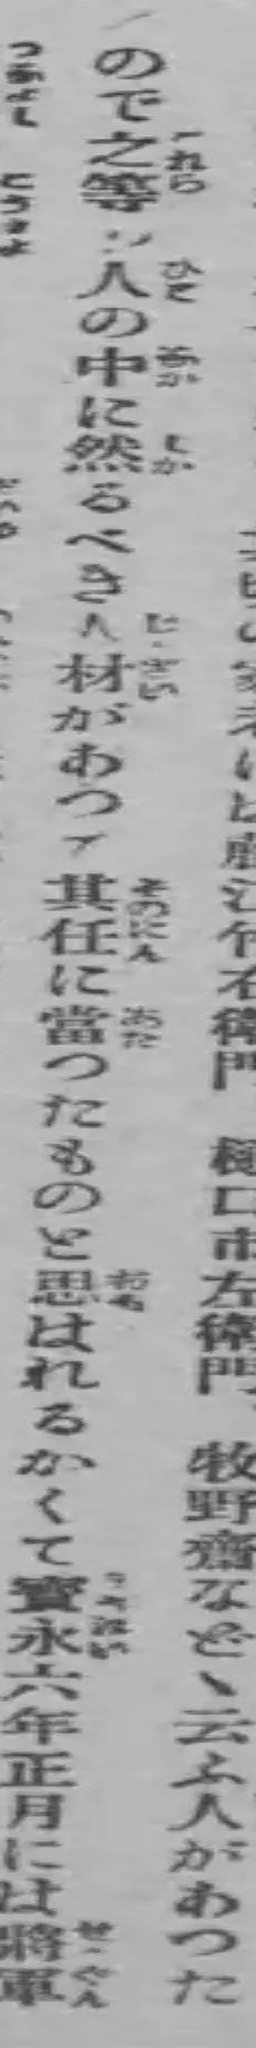ので之等の人の中に然るべき人材があつて其任に当つたものと思はれるかくて宝永六年正月には将軍
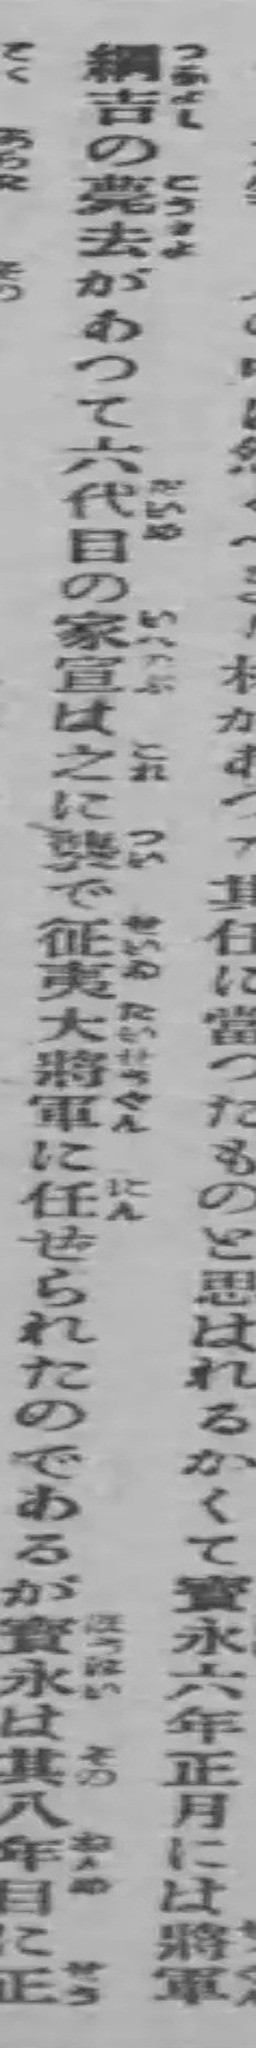綱吉の薨去があつて六代目の家宣は之に襲で征夷大将軍に任ぜられたのであるが宝永は其八年目に正
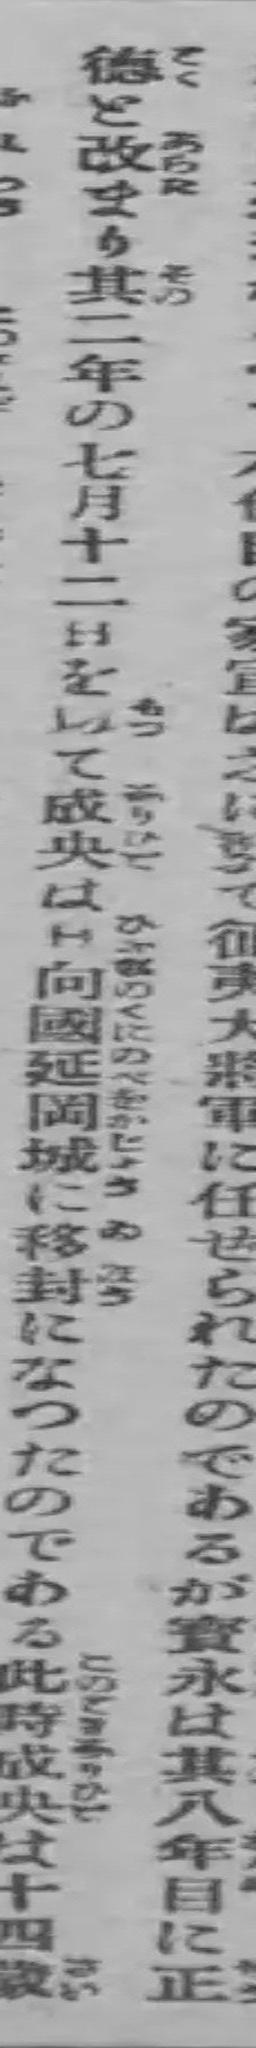徳と改まり其二年の七月十二日を以て成央は日向国延岡城に移封になつたのである此時成央は十四歳
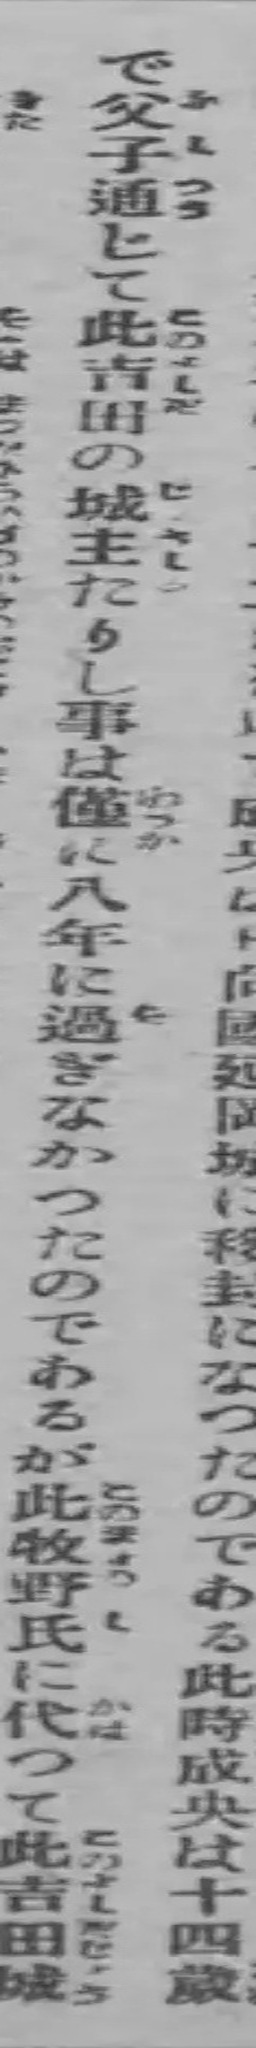で父子通じて此吉田の城主たりし事は僅に八年に過ぎなかつたのであるが此牧野氏に代つて此吉田城
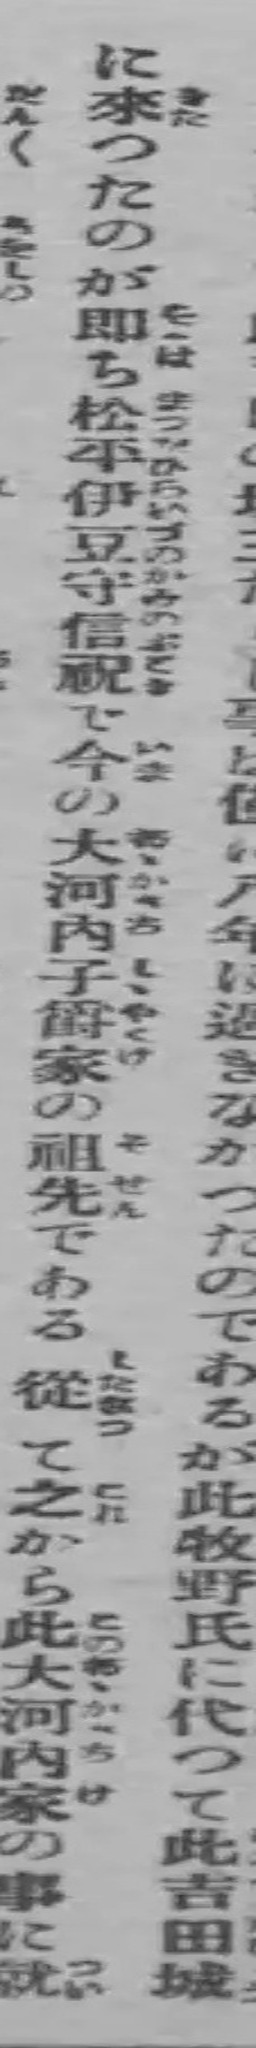松平信祝に来つたのが即ち松平伊豆守信祝で今の大河内子爵家の祖先である従て之から此大河内家の事に就
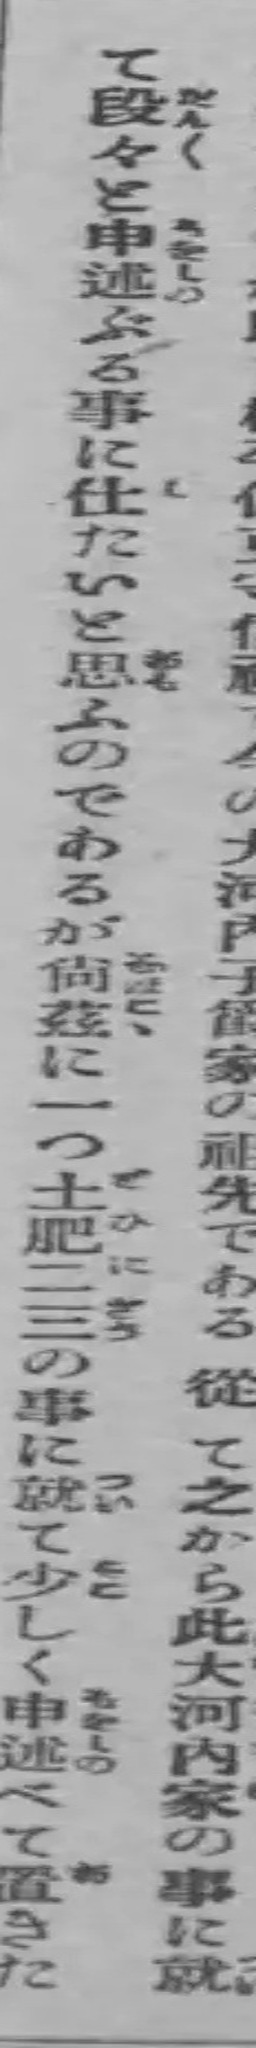て段々と申述ぶる事に仕たいと思ふのであるが尚茲に一つ土肥二三の事に就て少しく申述べて置きた
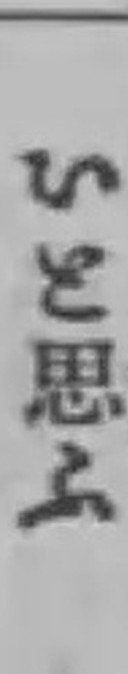いと思ふ
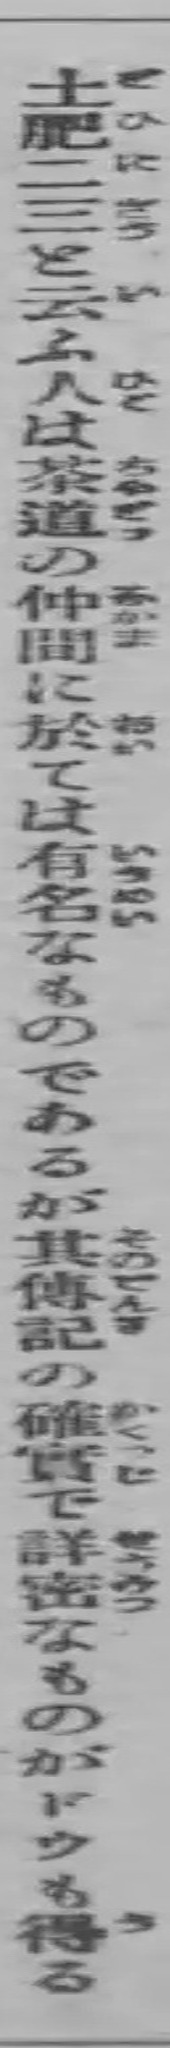土肥二三土肥二三と云ふ人は茶道の仲間に於ては有名なものであるが其伝記の確実で詳密なものがドウも得る
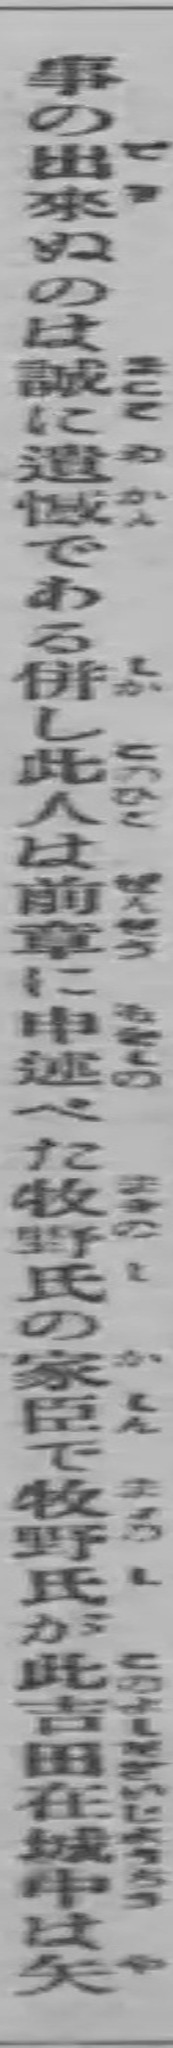事の出来ぬのは誠に遺憾である併し此人は前章に申述べた牧野氏家臣で牧野氏が此吉田在城中は矢
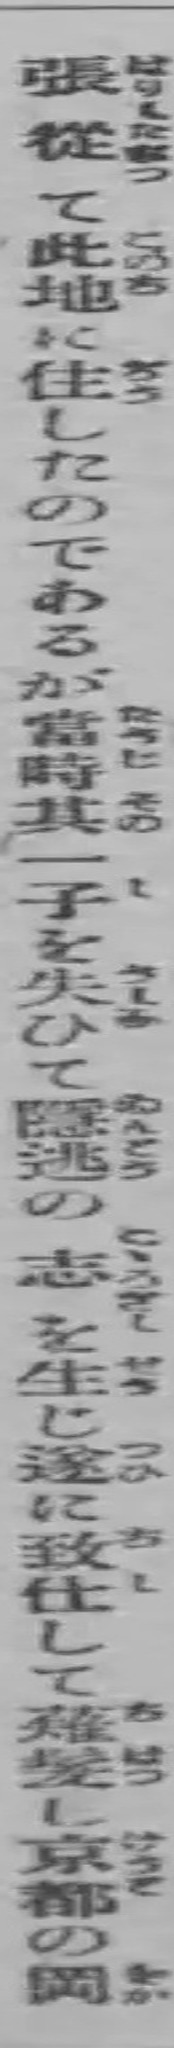張従て此地に住したのであるが当時其一子を失ひて隠逃の志を生じ遂に致仕して薙髪し京都の岡
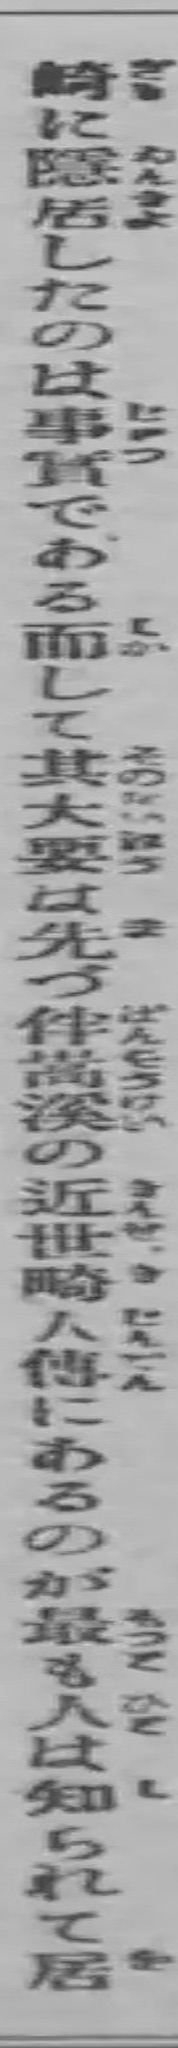崎に隠居したのは事実である而して其大要は先づ伴嵩渓の近世畸人伝にあるのが最も人は知られて居
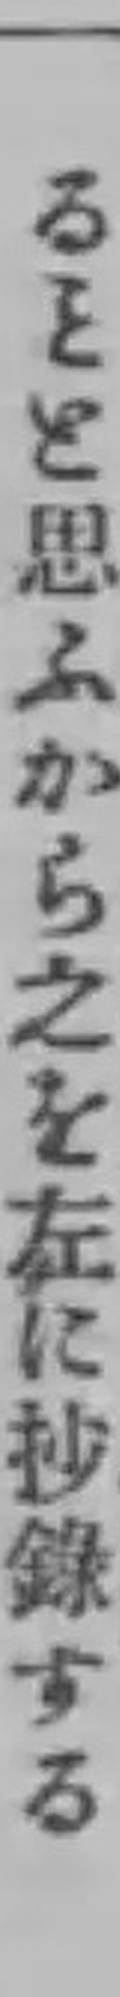ることと思ふからこれを左に抄録する
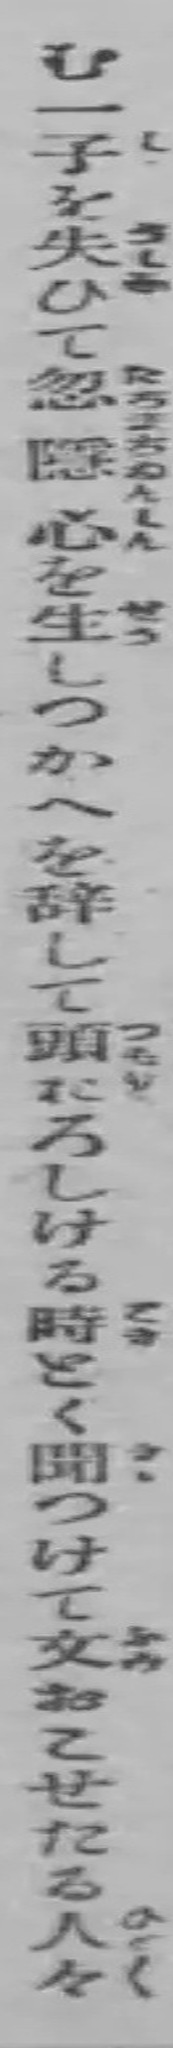む一子を失ひて忽隠心を生しつかへを辞して頭おろしける時とく聞つけて文おこせたる人々
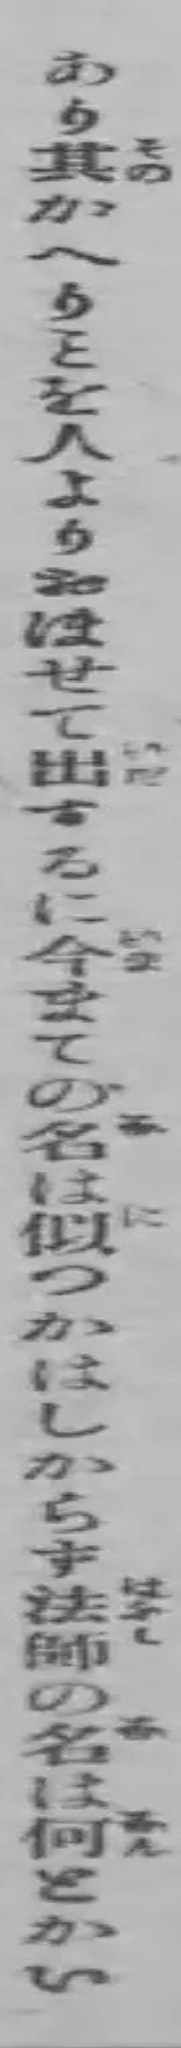あり其かへりことを人よりおほせて出するに今まての名は似つかはしからず法師の名は何とかい
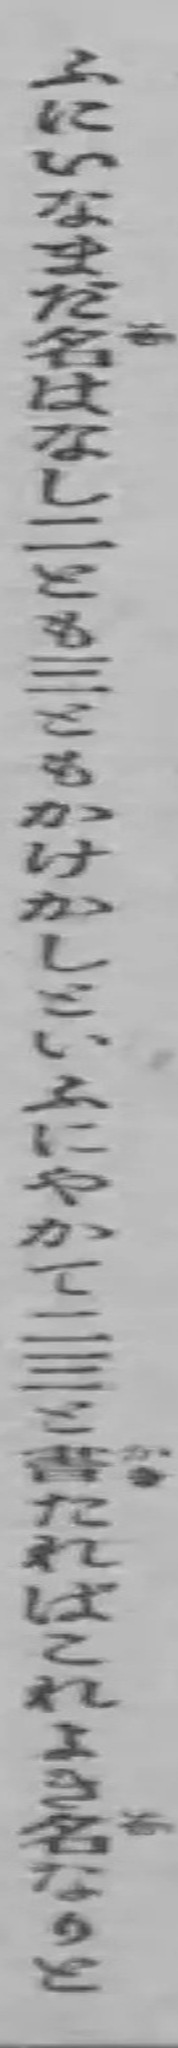ふにいなまだ名はなし二とも三ともかけかしといふにやかて二三と書たればこれよき名なりと
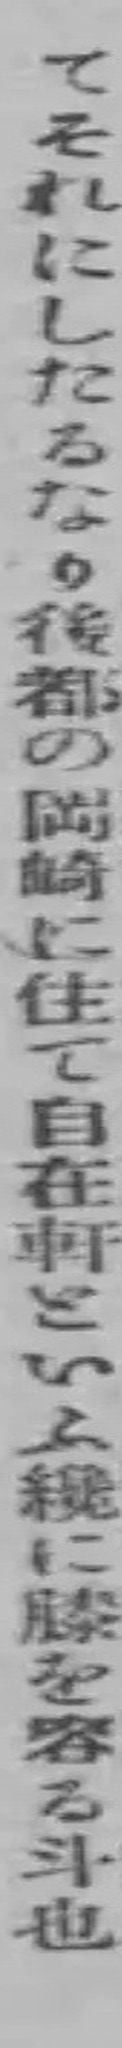てそれにしたるなり後都の岡崎に住て自在軒といふ纔に膝を容る斗也
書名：豊橋市史談
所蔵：国立国会図書館 National Diet Library, JAPAN
